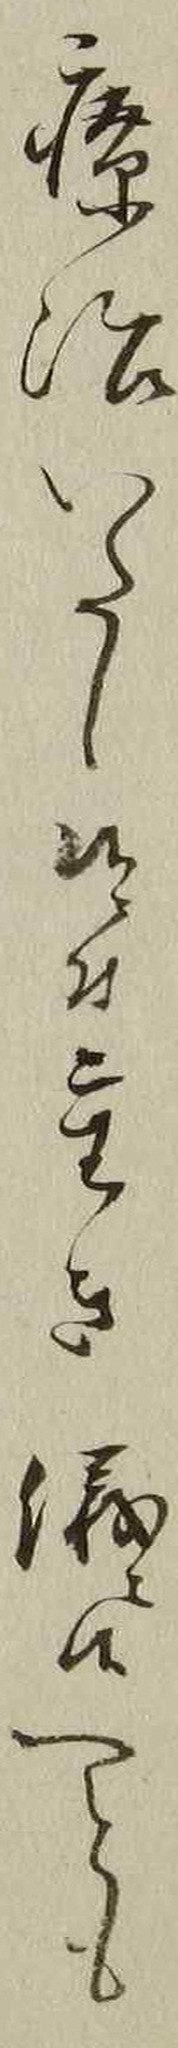療治いたし候ニ付重き儀ニ候へとも
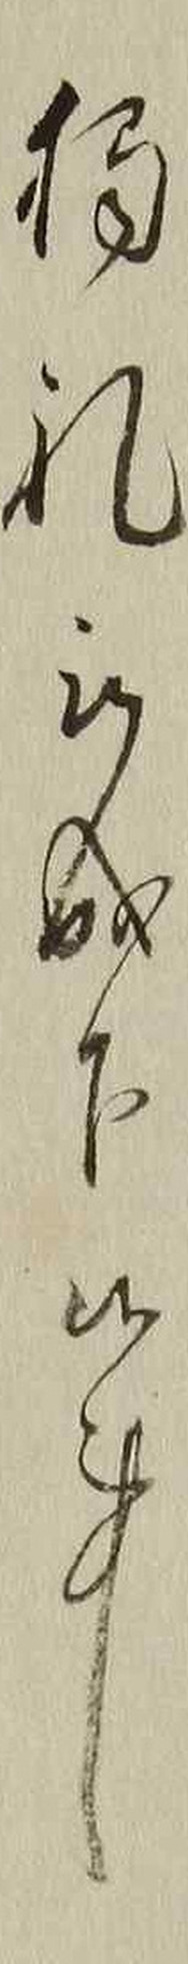独礼被成下候事
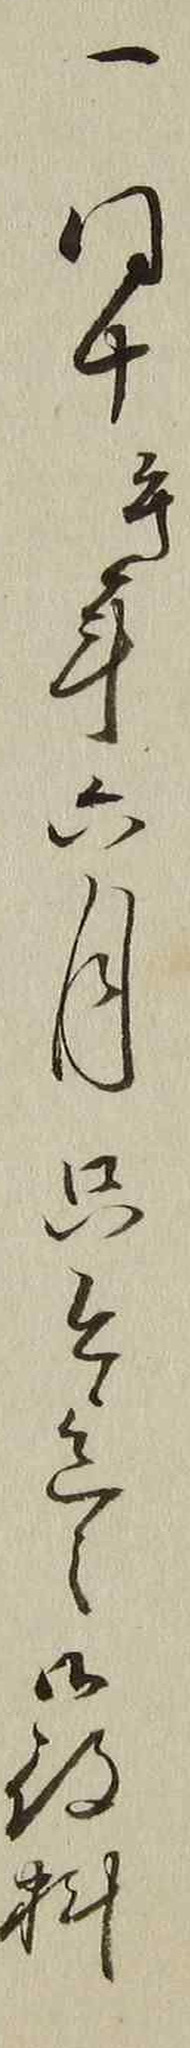一同十午年六月只今迄之御役料
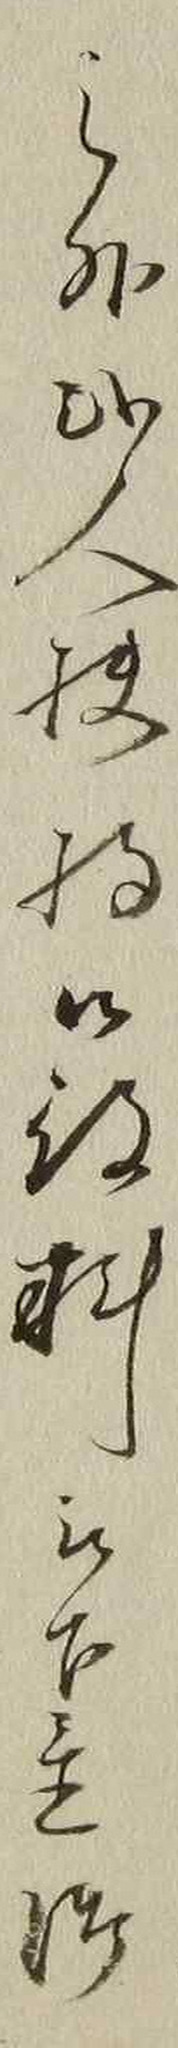之外弐人扶持御役料被下置御
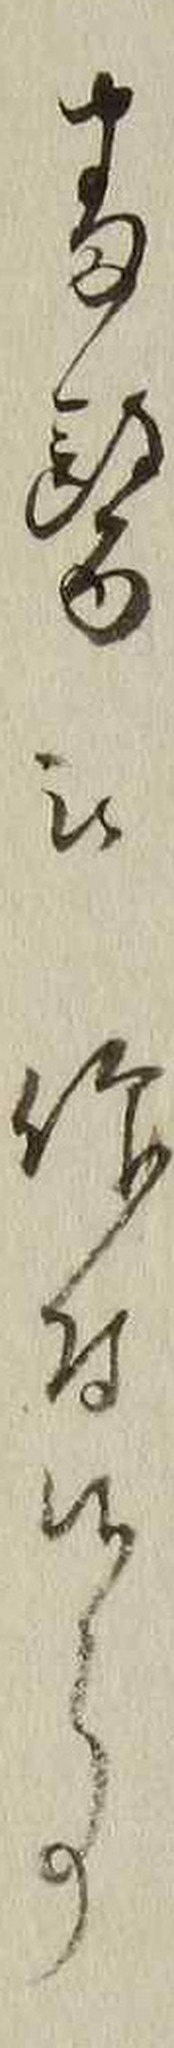番医被仰付候事
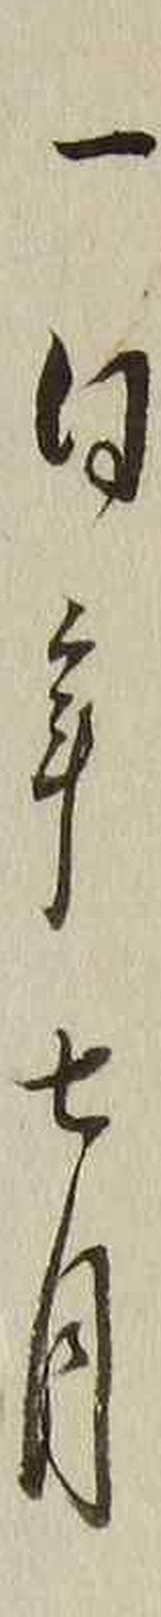一同年七月
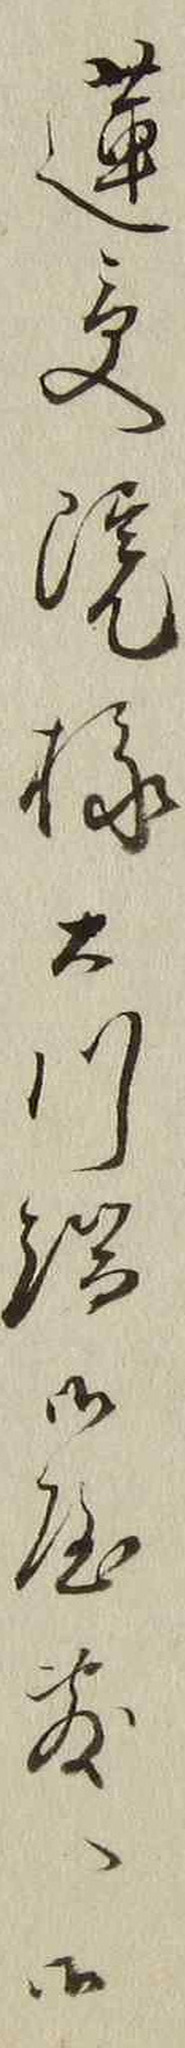蓮受院様大川端御屋敷へ御
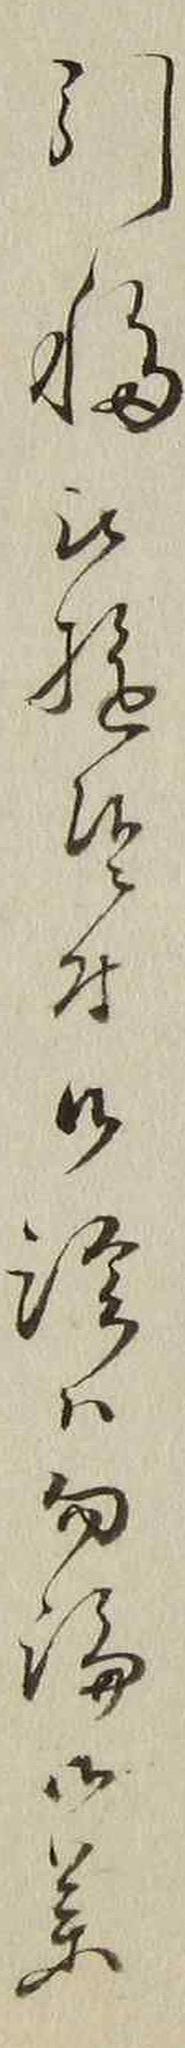引移被遊候ニ付御診ハ勿論御薬
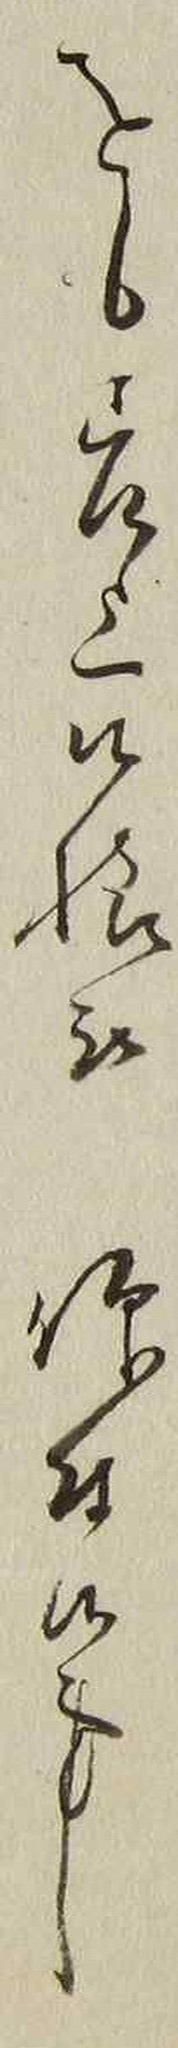をも差上候様被仰付候事
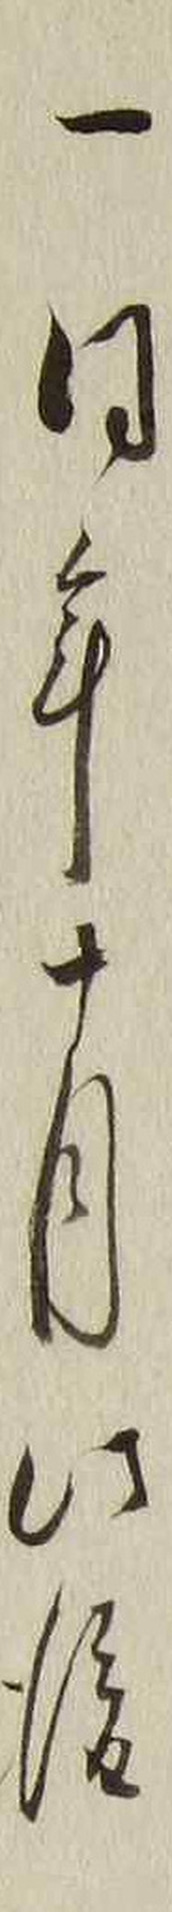一同年十月此後
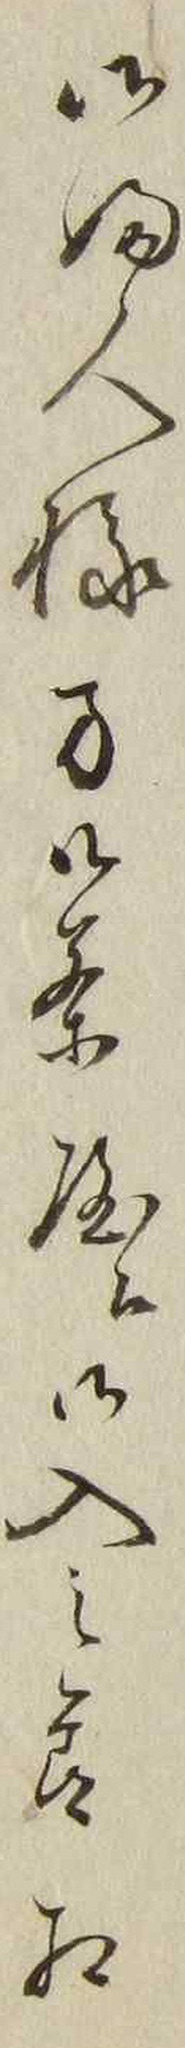御婦人様方御茶屋江御入之節相
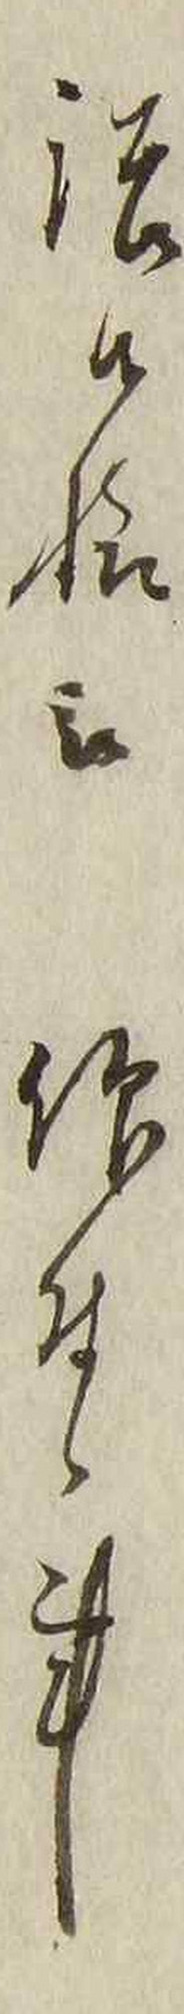話候様被仰付候事
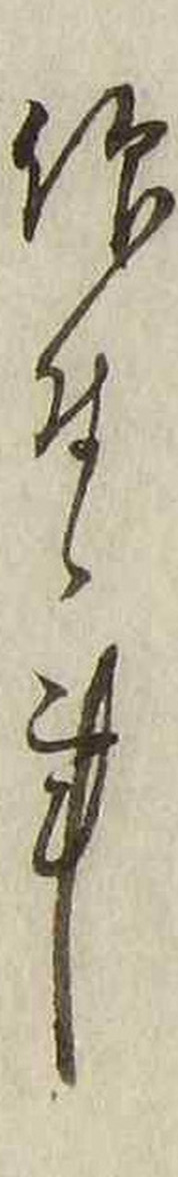仰出候事

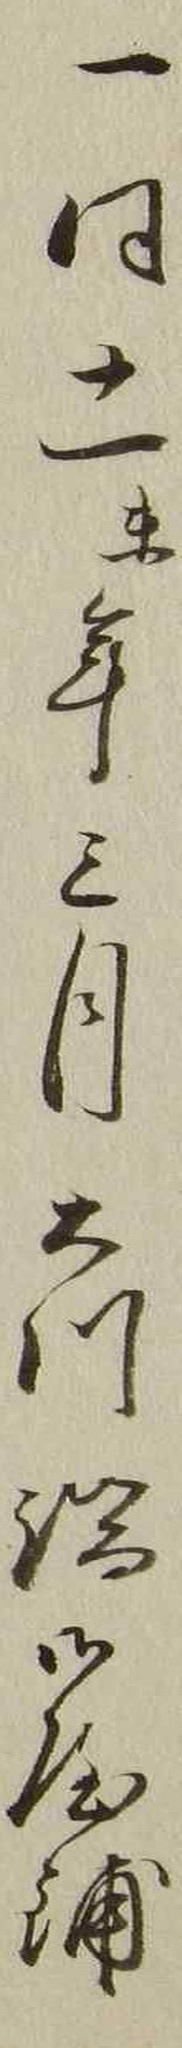一同十一未年三月大川端御屋鋪
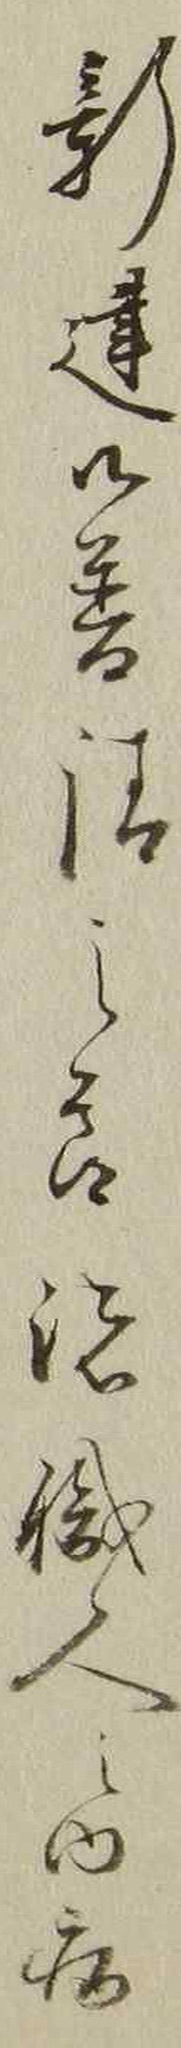新建御普請之節諸職人之内病
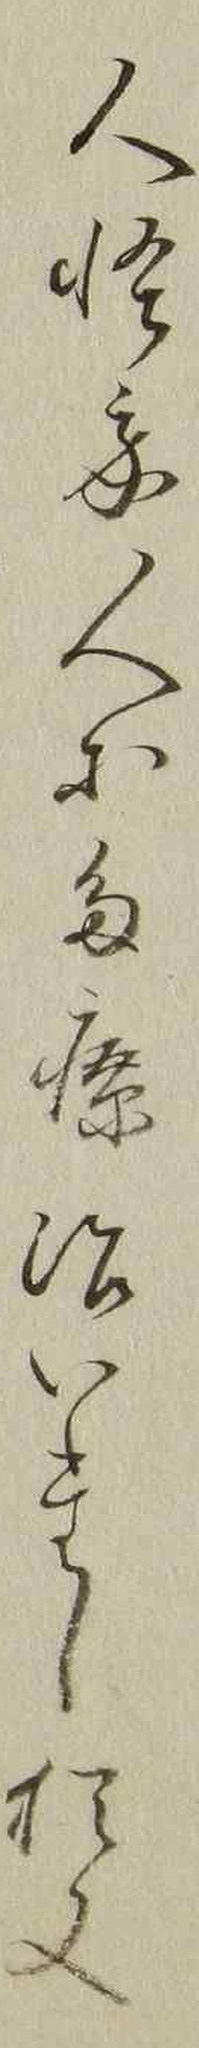人怪我人等多療治いたし猶又
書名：諸士系譜　巻之129　た之部5
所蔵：会津若松市立会津図書館
